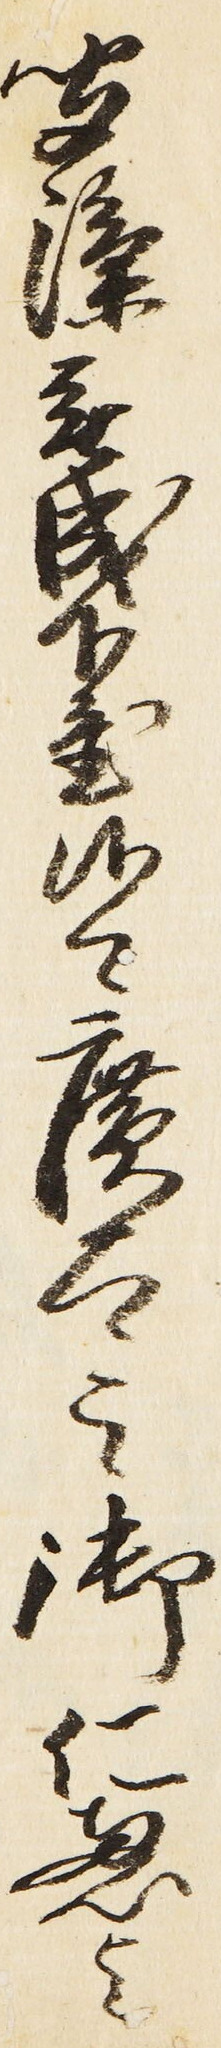聞済被成下置候ハヽ広大之御仁恵与
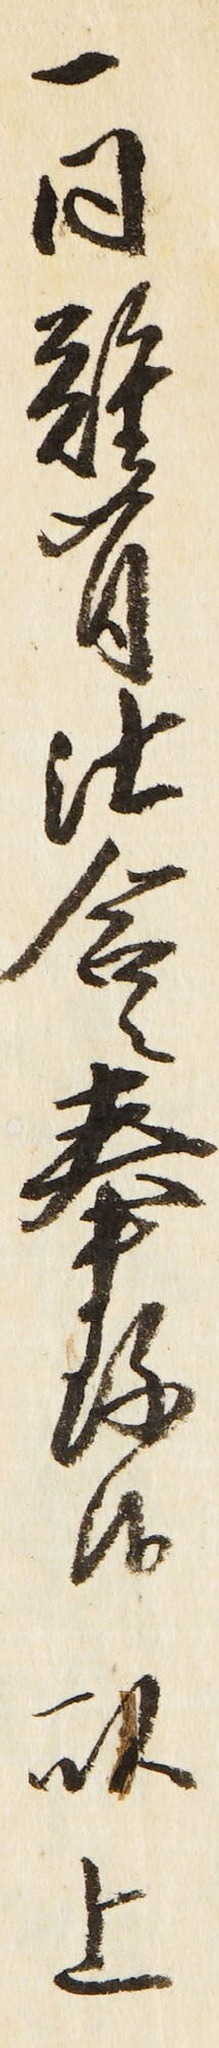一同難有仕合ニ奉存候以上
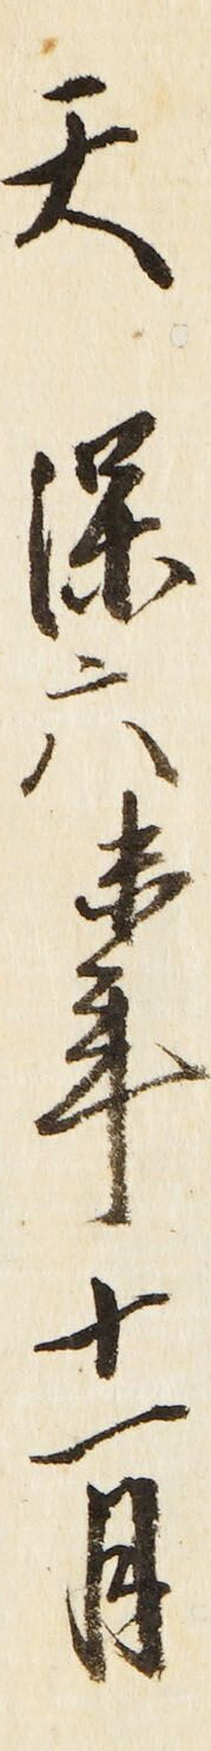天保六未年十一月
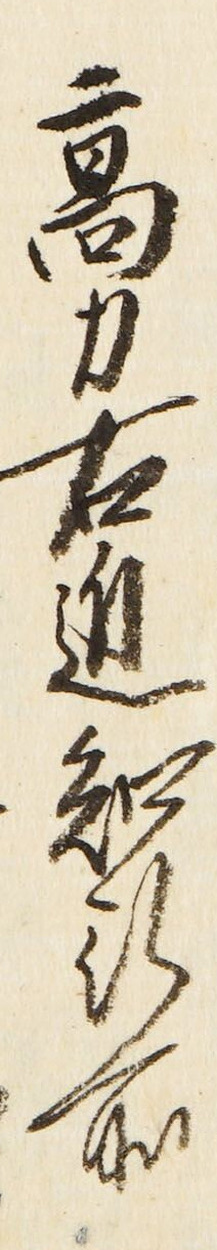高力右近知行所
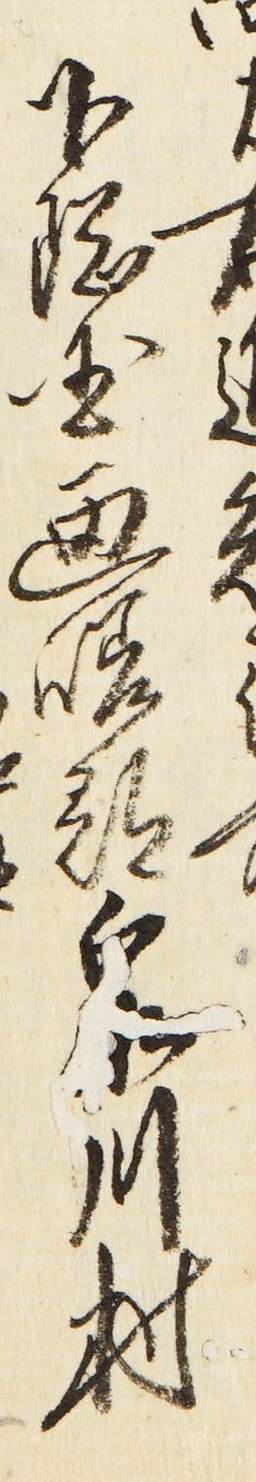下総国匝瑳郡泉川村
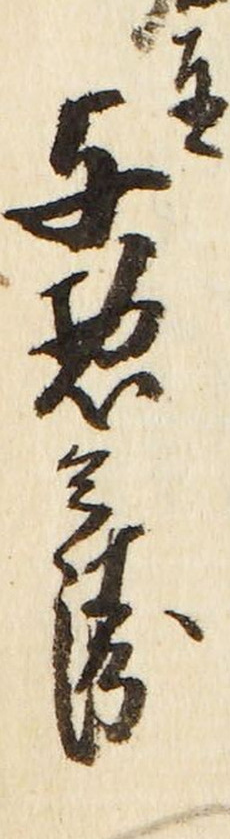与惣兵衛

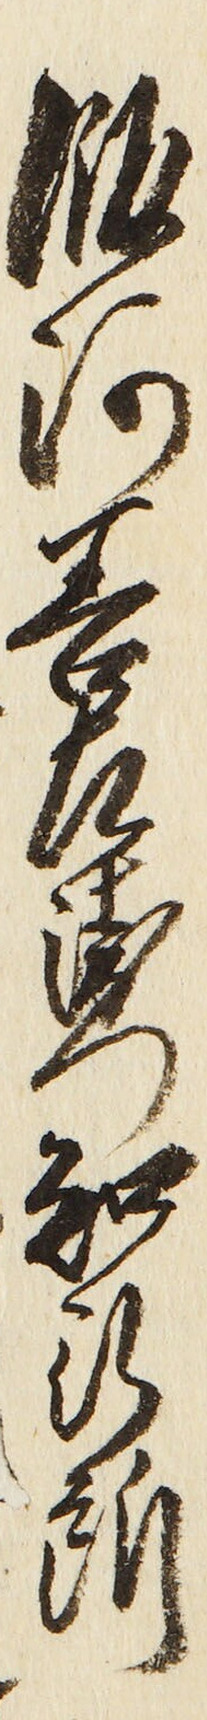飯河善左衛門知行所
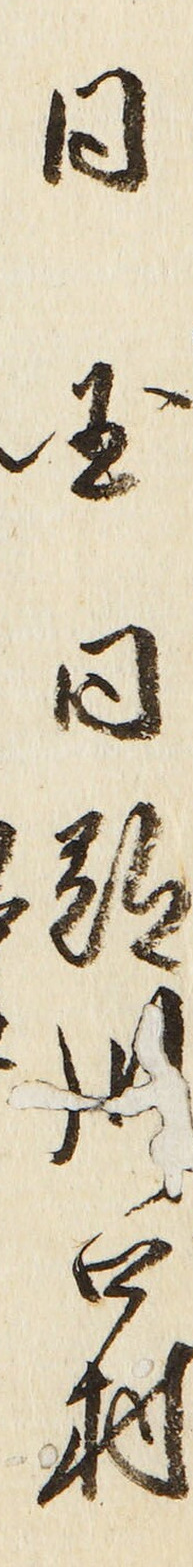同国同郡川口村
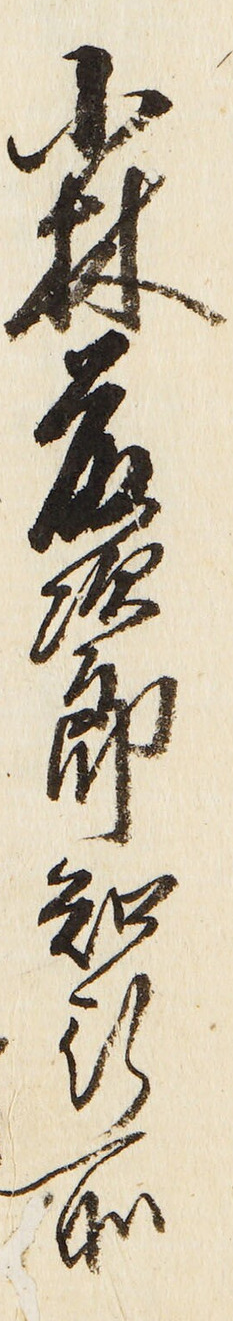小林藤次郎知行所
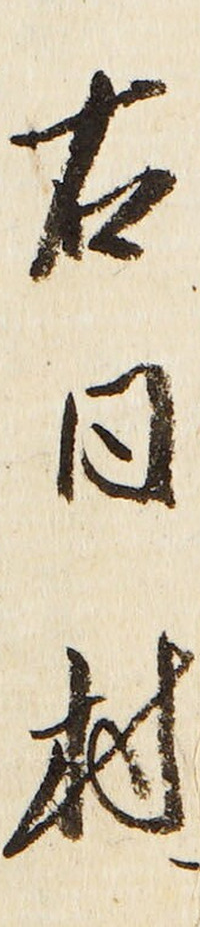右同村
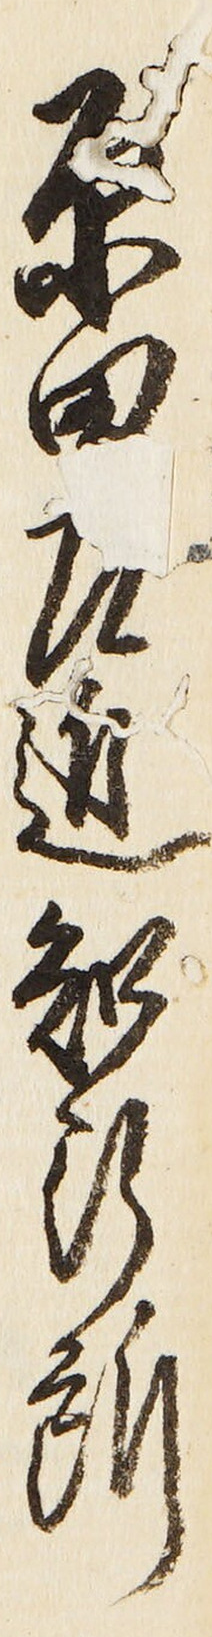原田左近知行所
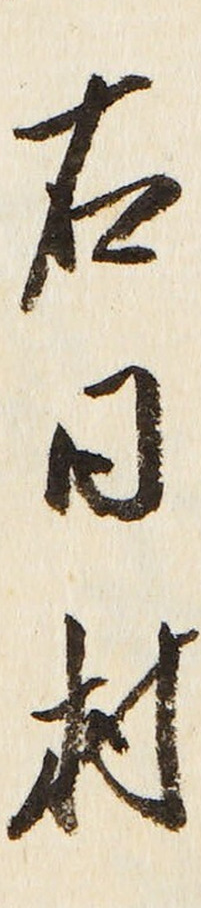右同村
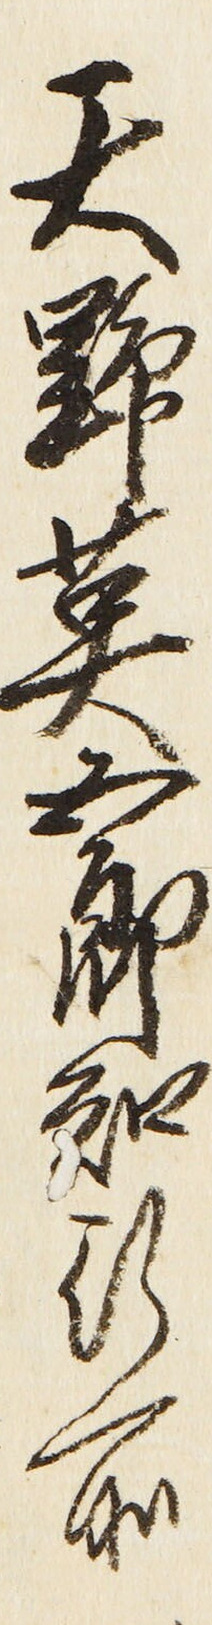天野英五郎知行所
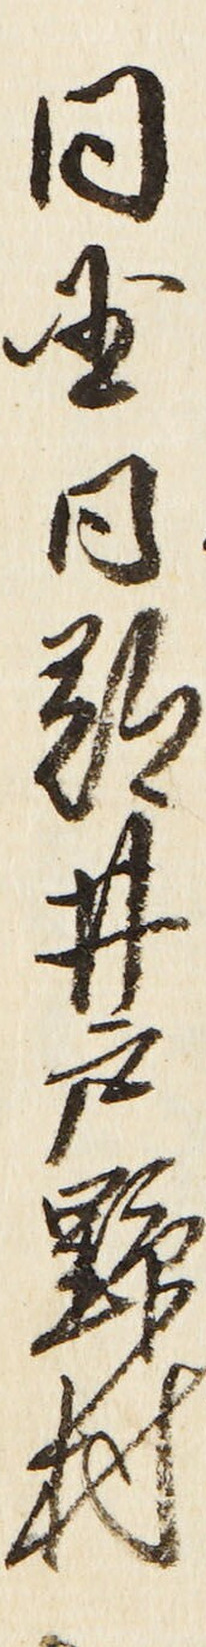同国同郡井戸野村

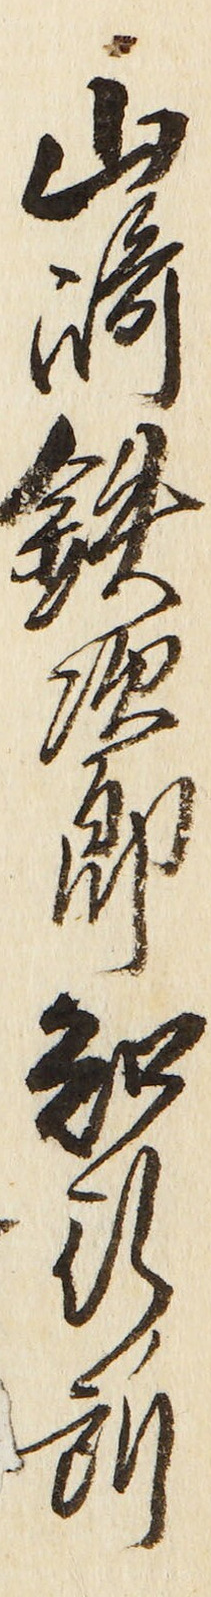山崎鉄次郎知行所
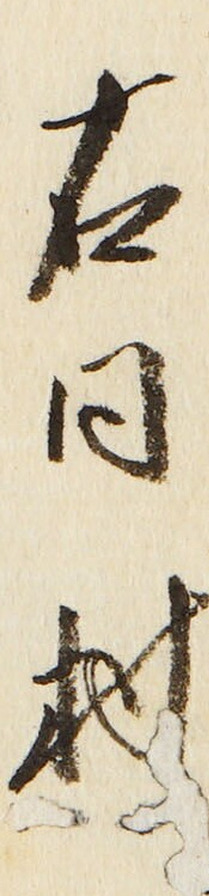右同村
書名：難船一件記録
